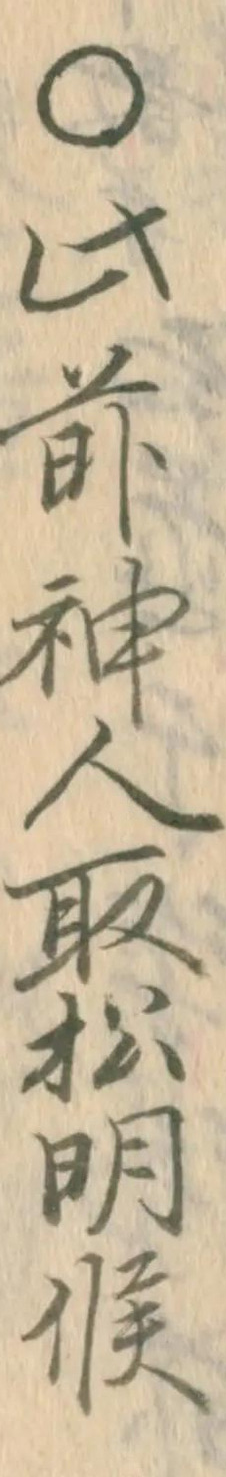〇此前神人取松明候

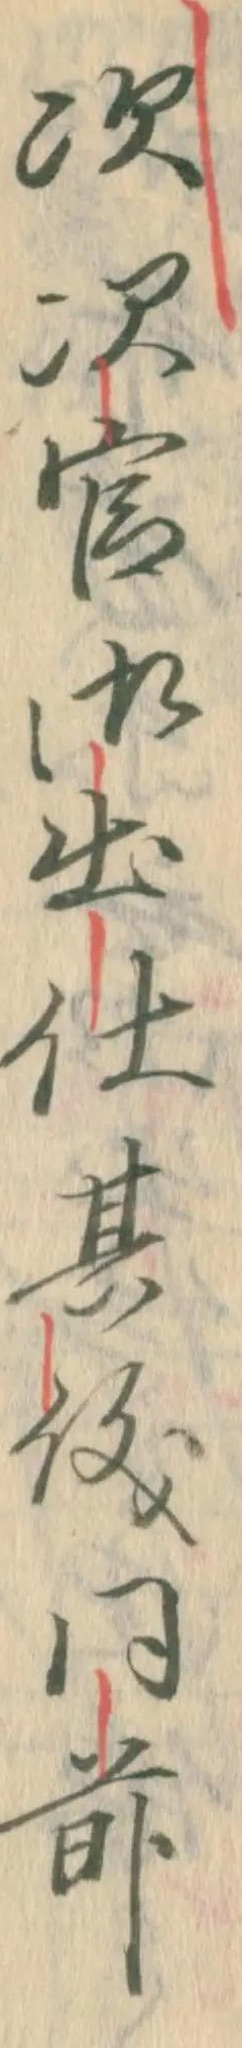次次-官御-出-仕其_儀同-前
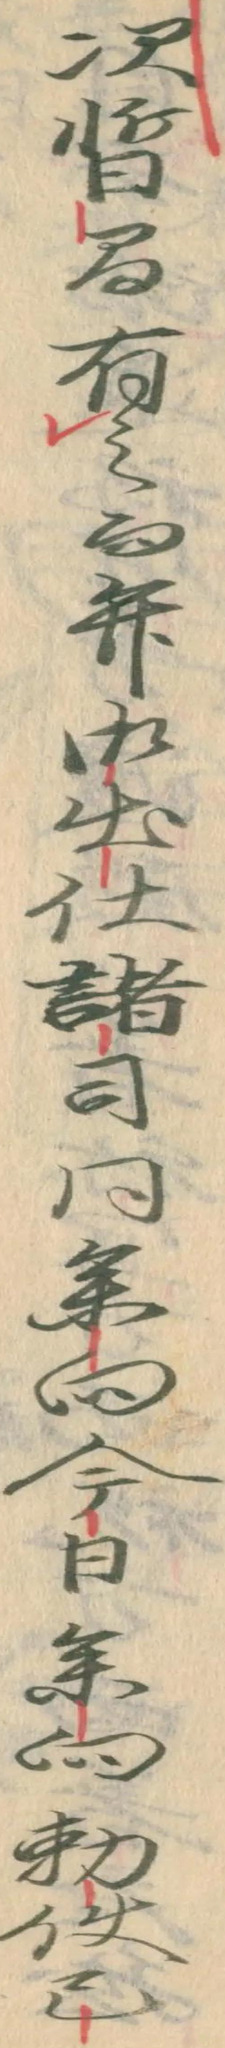次暫_間有之而弁御-出-仕諸-司同参-向今-日参-向勅-使已-

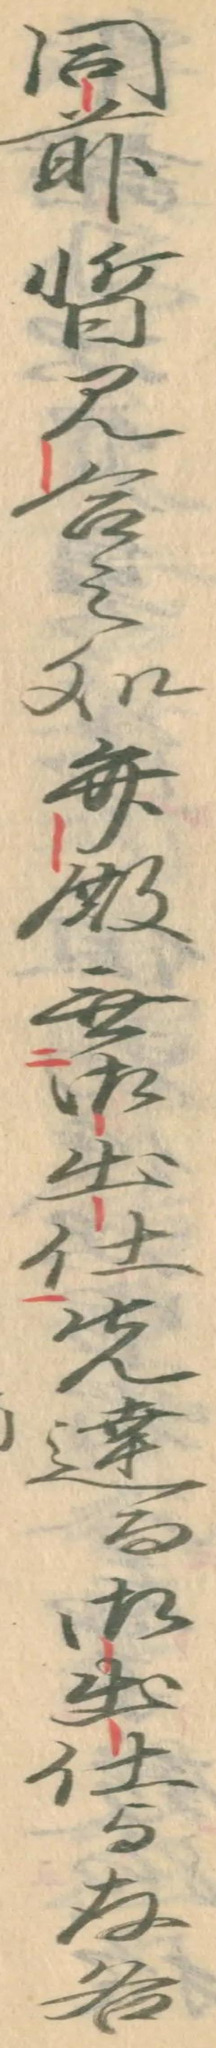同-前暫見_合之処弁_殿無御-出-仕先達而御-出-仕与存各
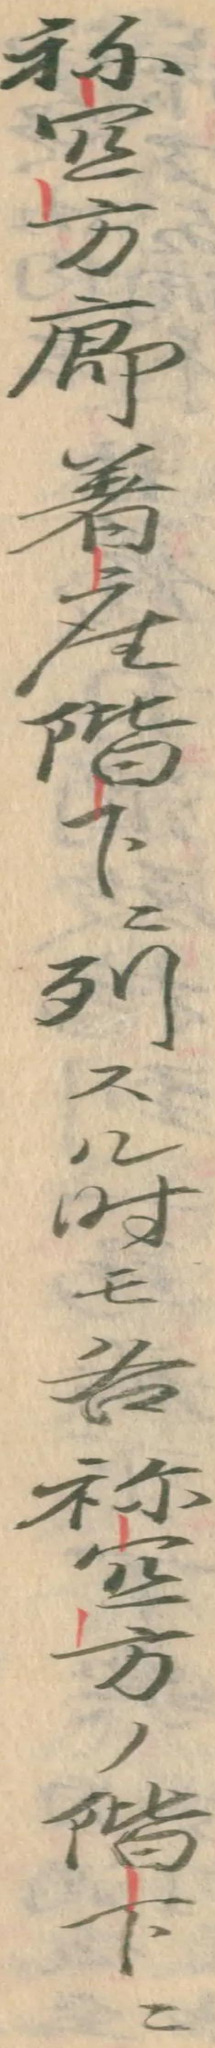祢-宜_方廊着_座階-下ニ列スル時モ各祢-宜_方ノ階-下ニ
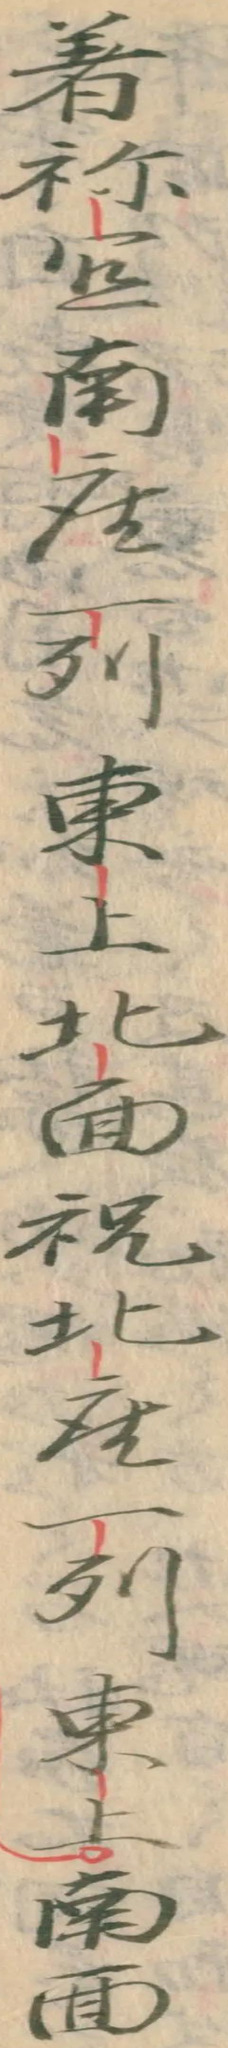着祢-宜南_座一-列東-上北-面祝北-座一-列東-上￮南面
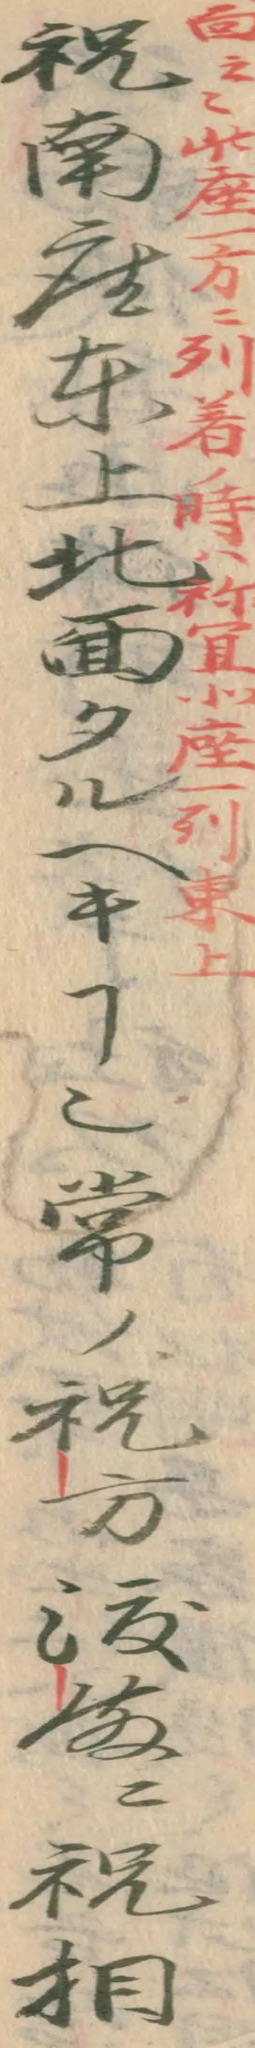祝南座東上北面タルヘキコト也常ノ祝_方渡_殿ニ祝相
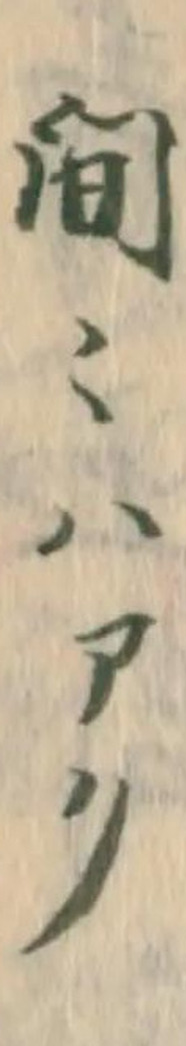間々ハアク
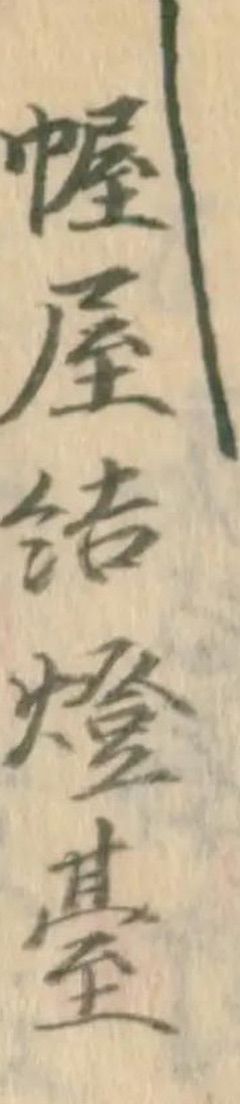幄屋結燈台
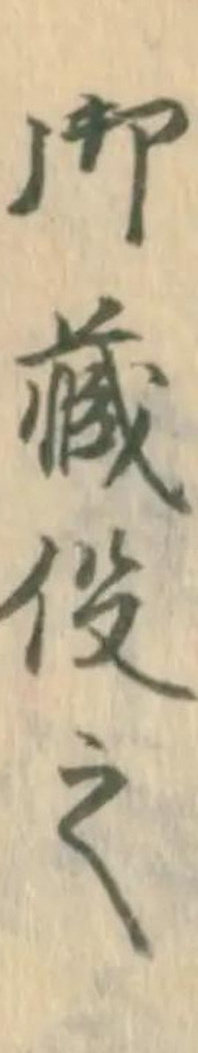御蔵役之
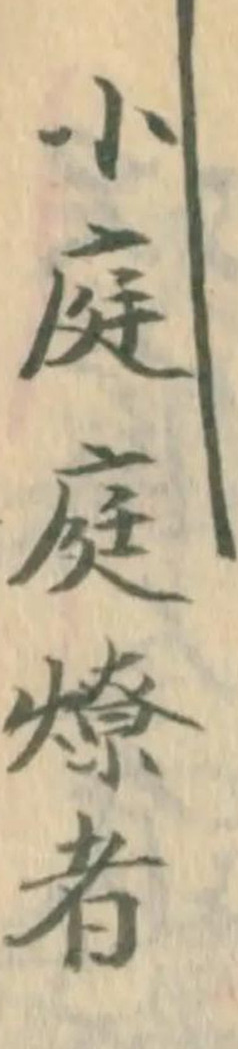小庭庭燎者

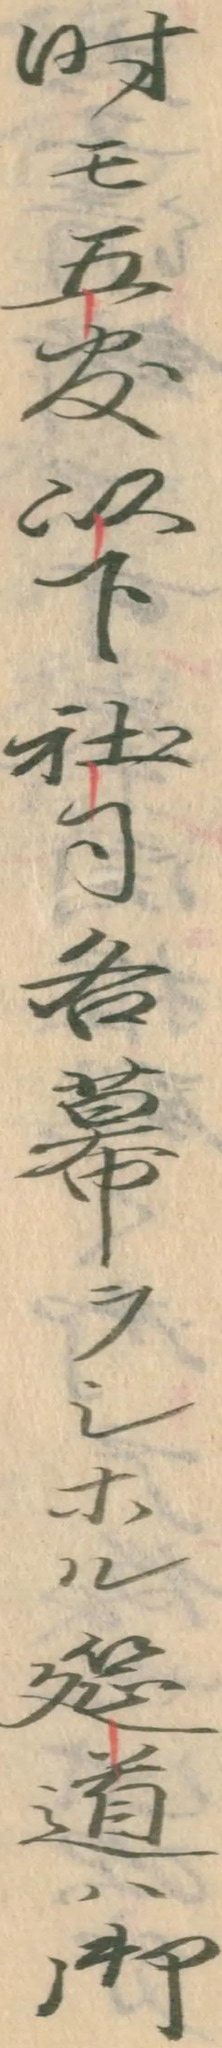時モ五-官以-下社-司各幕ヲシホル筵-道ハ御
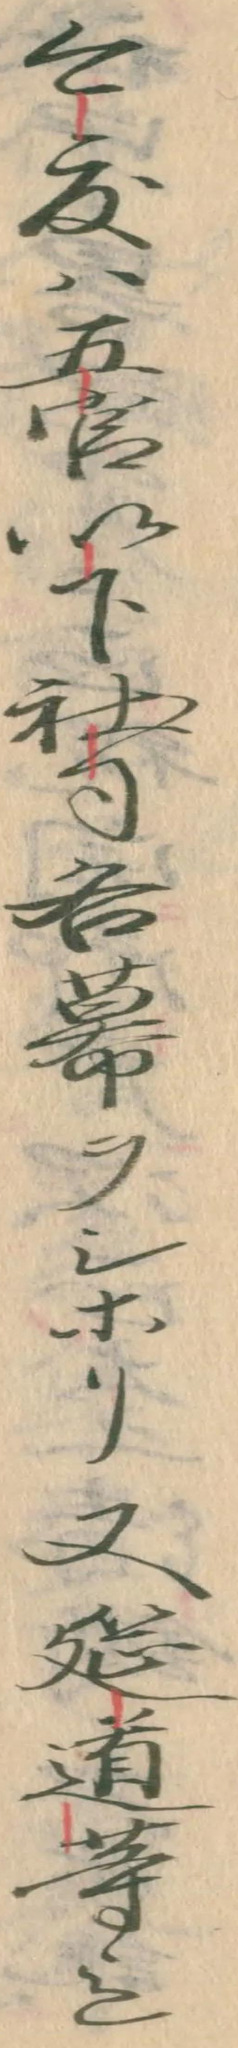今-度ハ五-官以-下社-司各幕ヲシホリ又延-道_等迄
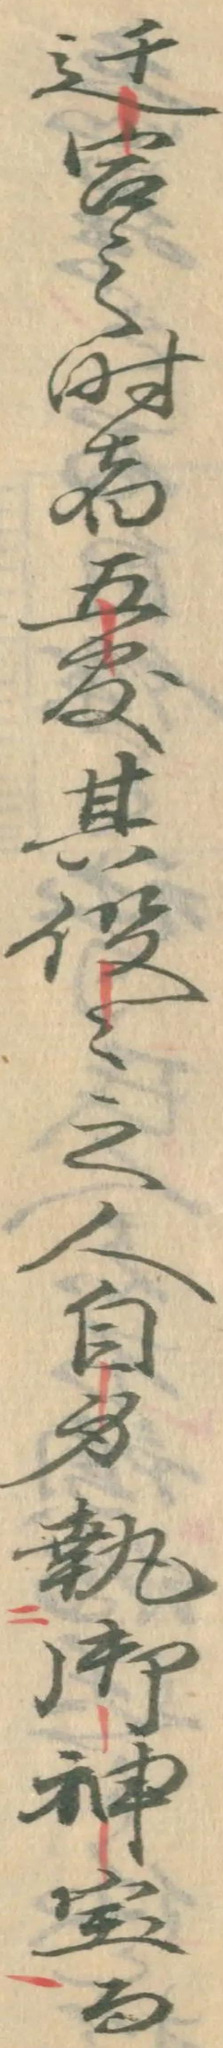迁-宮之時者五-官其役-々之人自-身執御-神-宝而

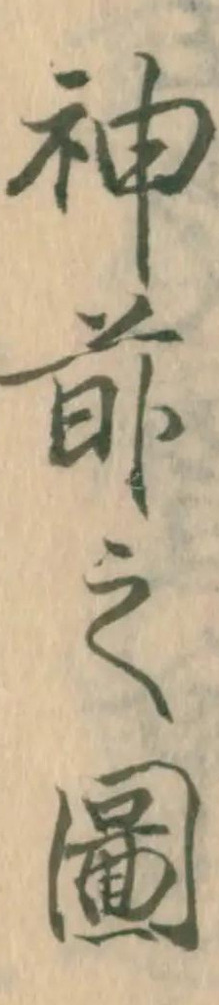神前之図

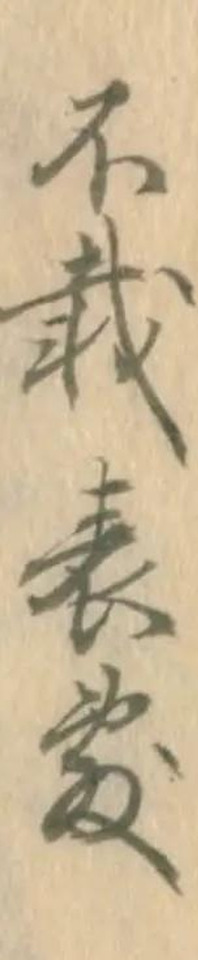不載表敷
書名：賀茂社記録. 第16冊
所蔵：国立国会図書館 National Diet Library, JAPAN
